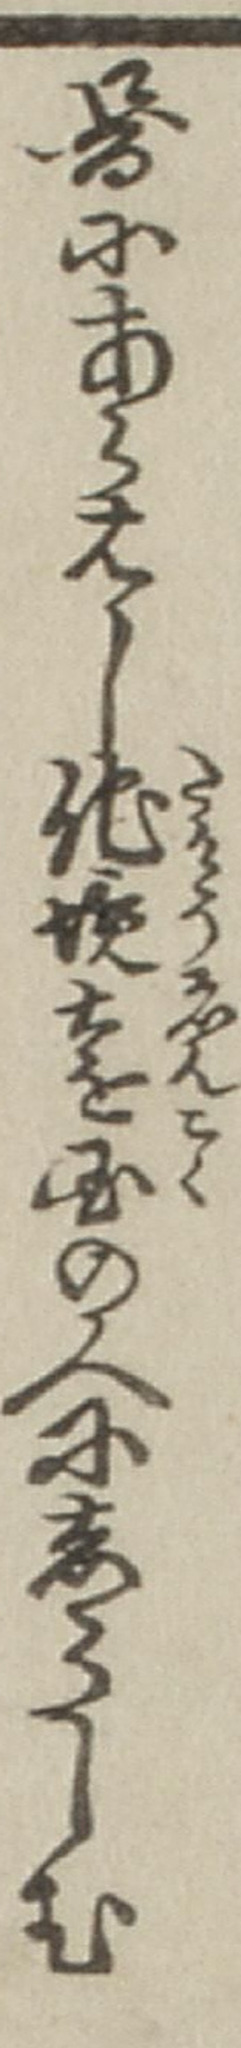図にあらはし他境遠国の人にしらしむ
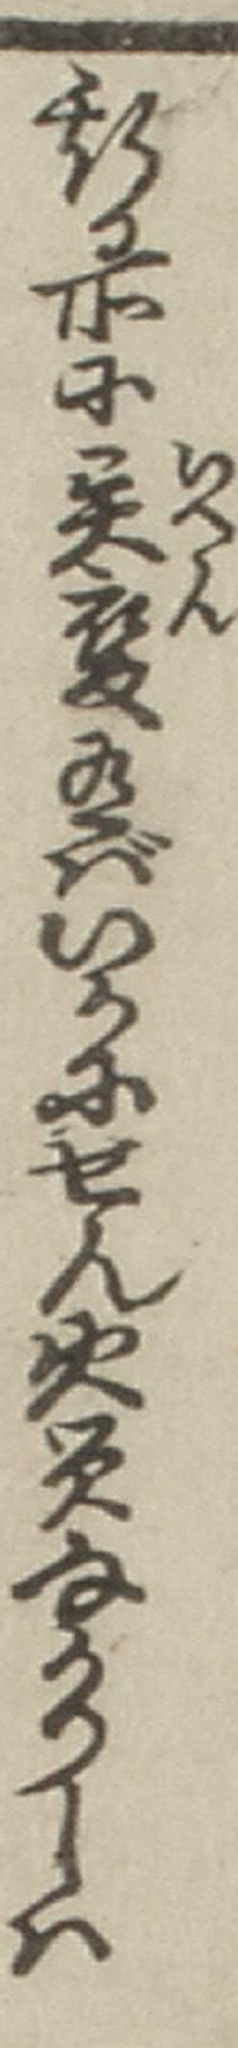斯る所に異変有ばいかにせん火災なかりしは
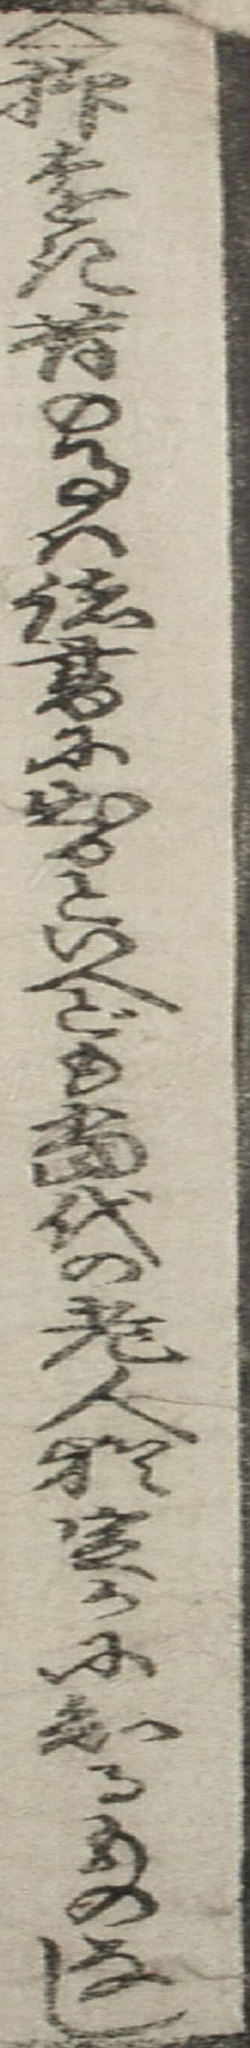△抑遠き昔の事は諸書に出るといへども当代の老人程定かに知るものなし
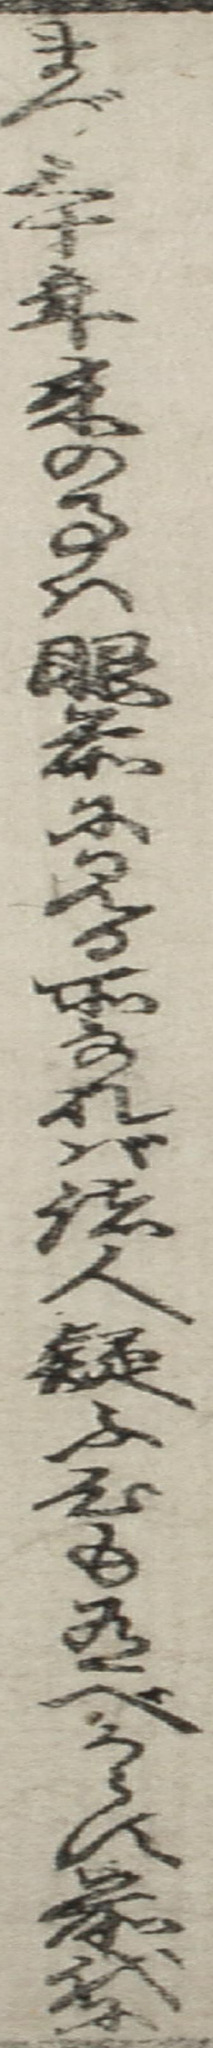まづ三十年来の事は眼前に見る所なれば諸人疑ふ心も有べからす前代に
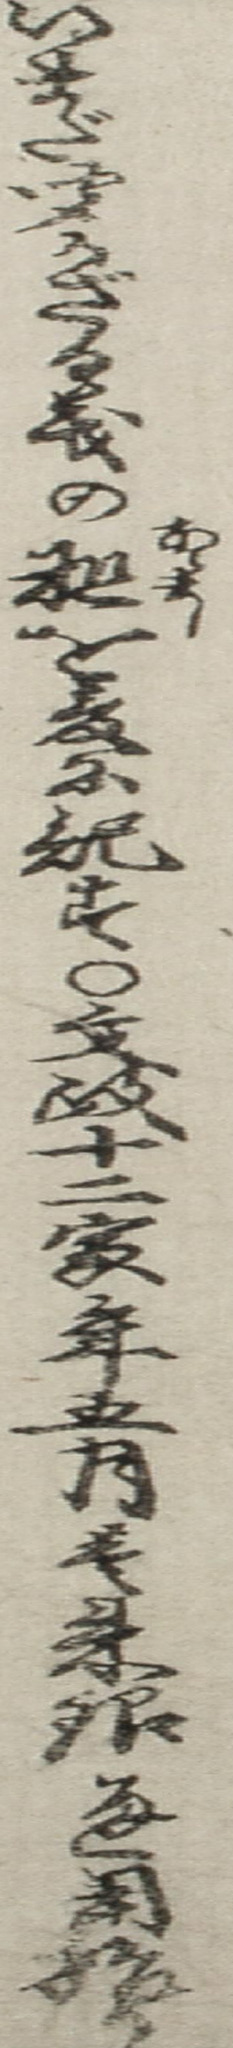いまだ聞かざる義の粗を爰に記す〇文政十二寅年五月壱朱銀通用始り
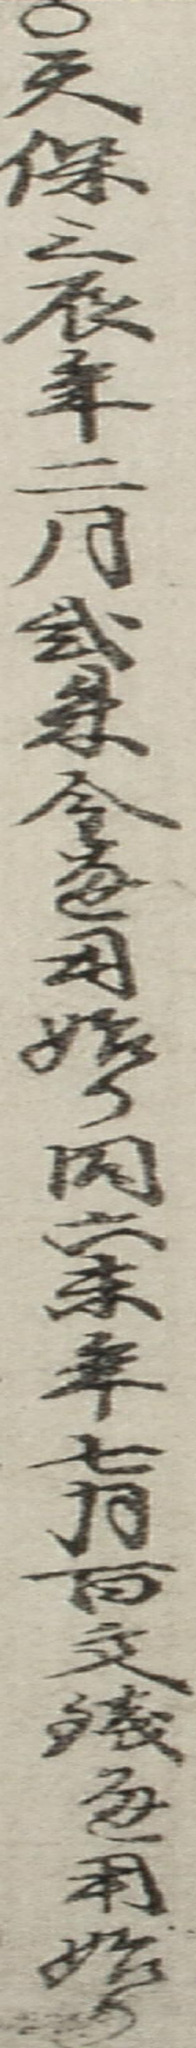〇天保三辰年二月弐朱金通用始り同六未年七月百文銭通用始り
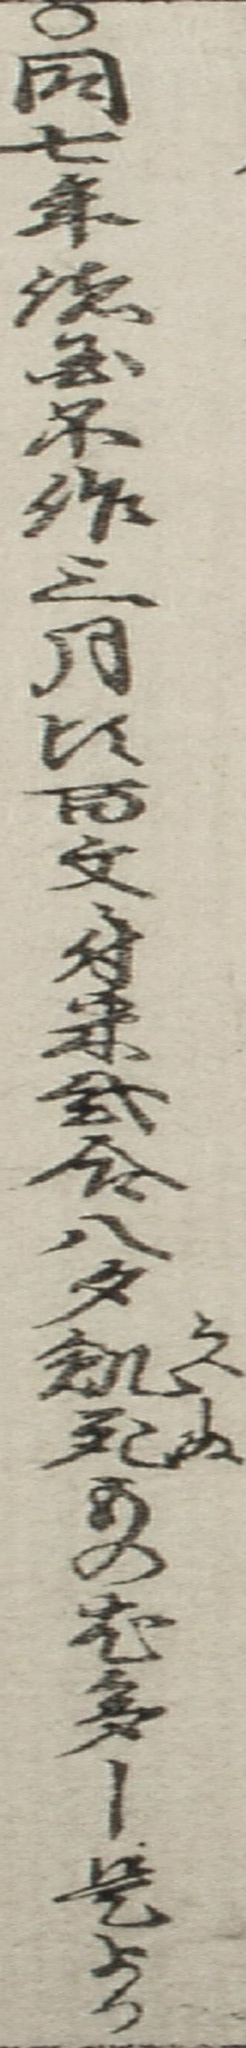〇同七年諸国不作三月頃百文に付米弐合八勺飢死もの尤多し是より
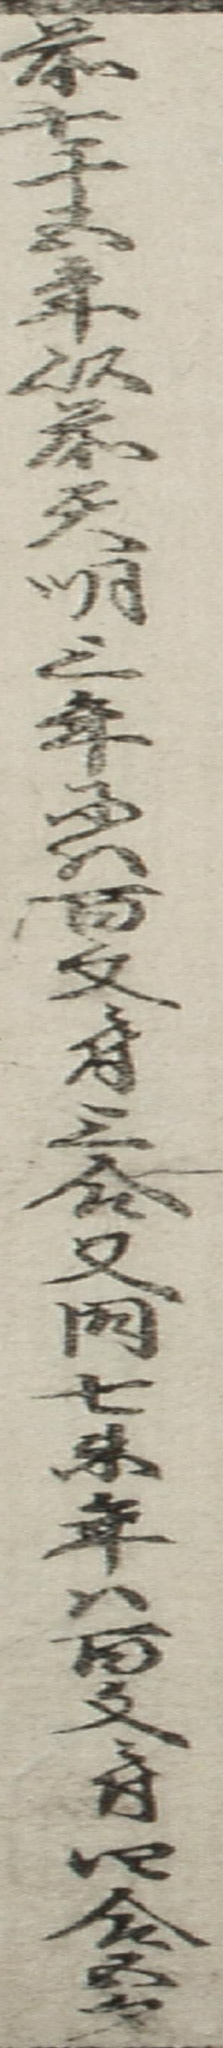前七十五年以前天明三年には百文に付三合又同七未年は百文に付四合五勺
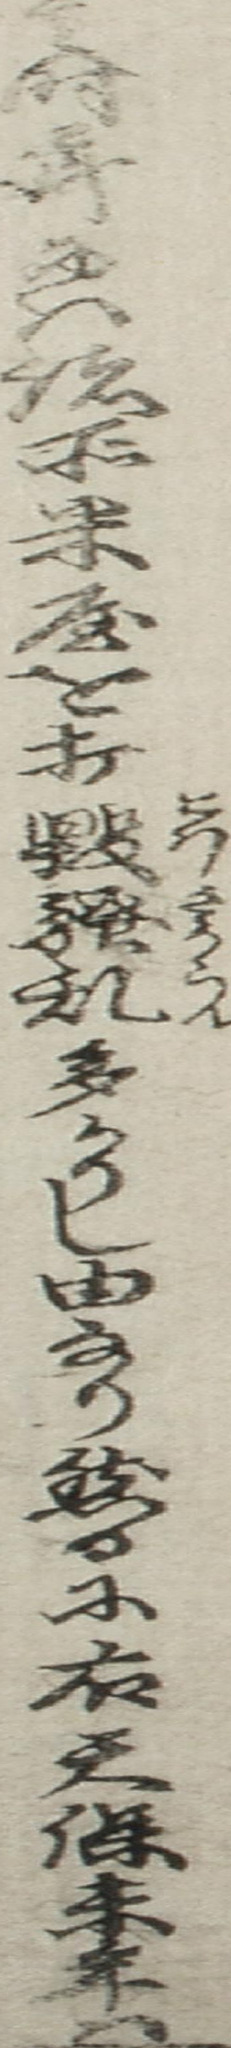其時節には諸所米屋を打毀騒乱多かりし由なり然るに右天保未年は
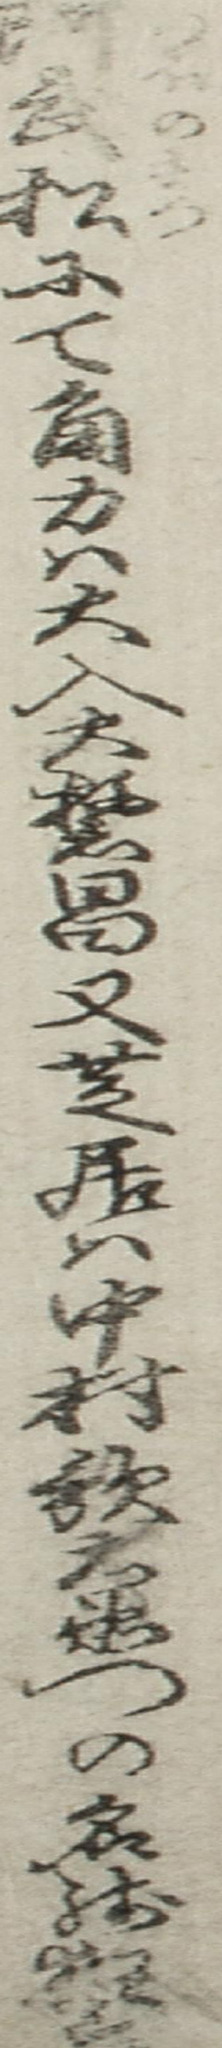稲妻阿武松にて角力は大入大繁昌又芝居は中村歌右衛門の名残狂言
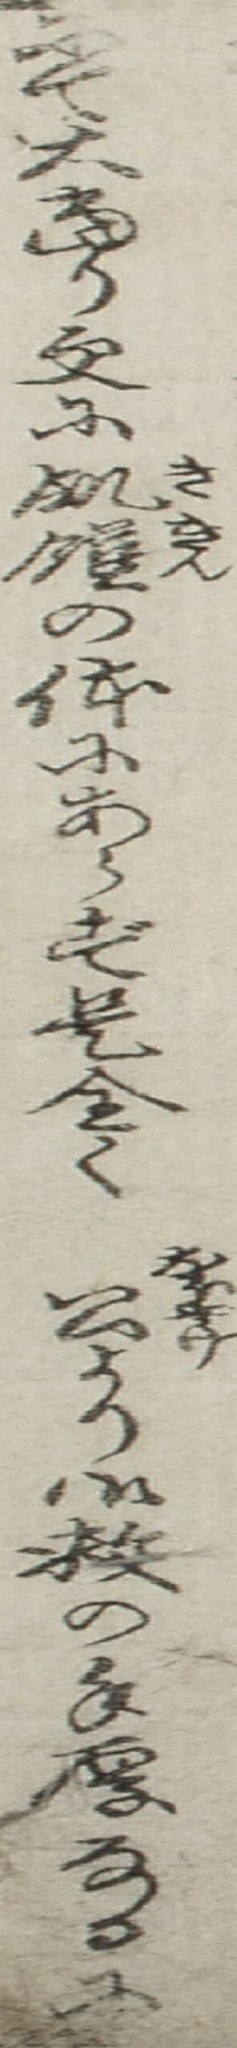にて大当り更に飢饉の体にあらず是全く公より御救の手厚なるに
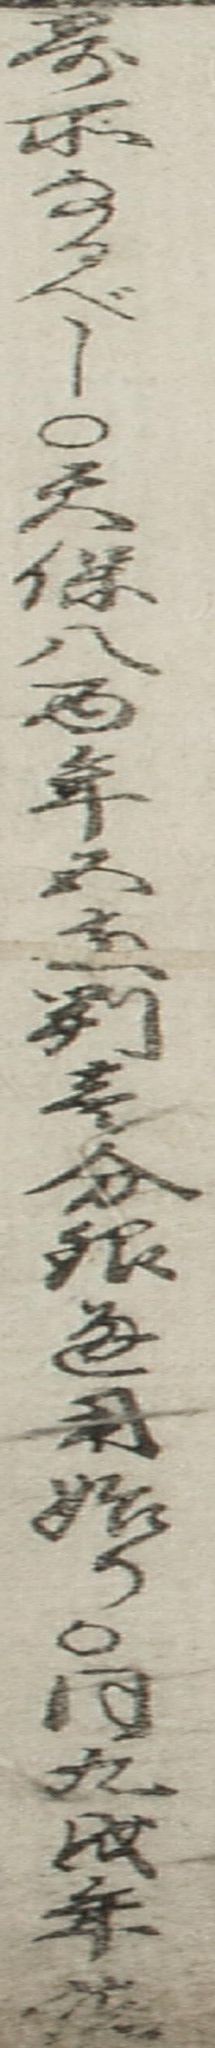寄所なるべし〇天保八酉年五両判壱分銀通用始り〇同九戌年諸
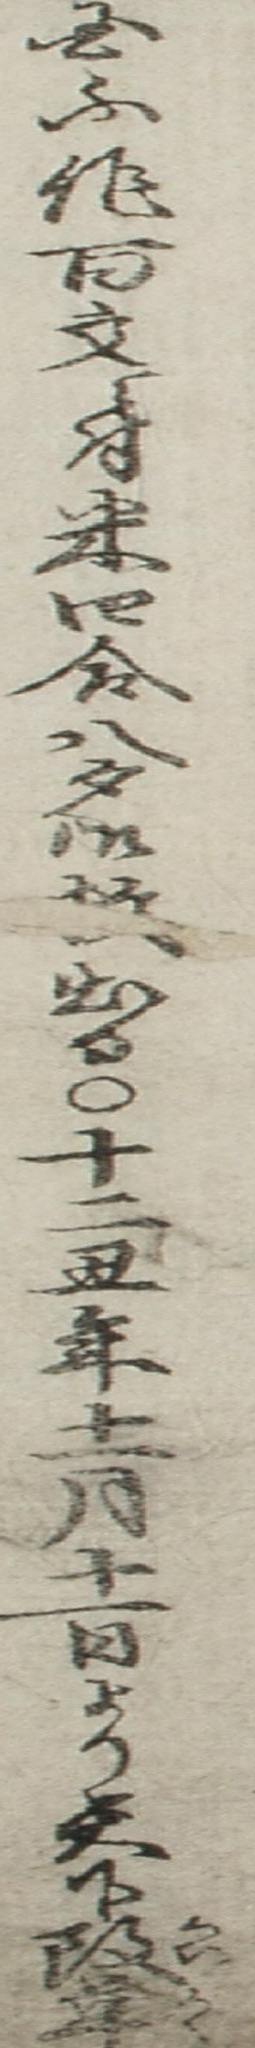国不作百文に付米四合八勺御救出る〇十二丑年十一月十一日より天下改革
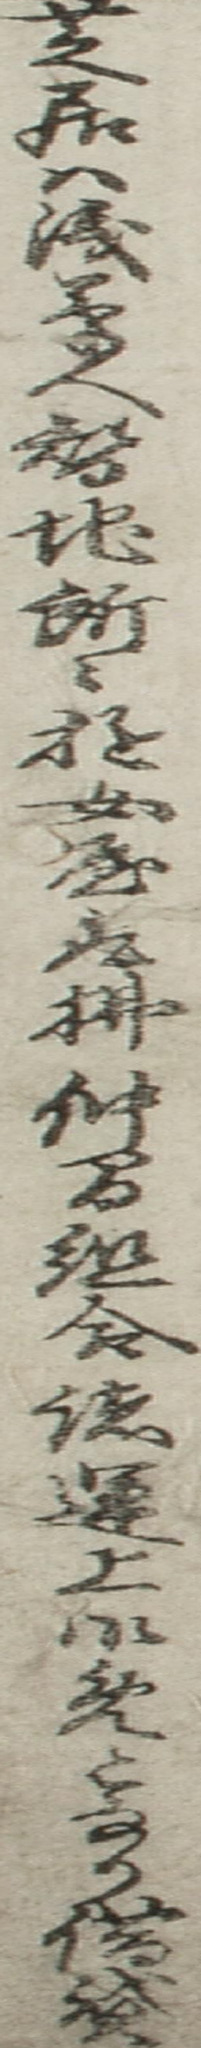芝居は浅草へ替地所々遊女屋取払仲間組合諸運上御免となり借貸に

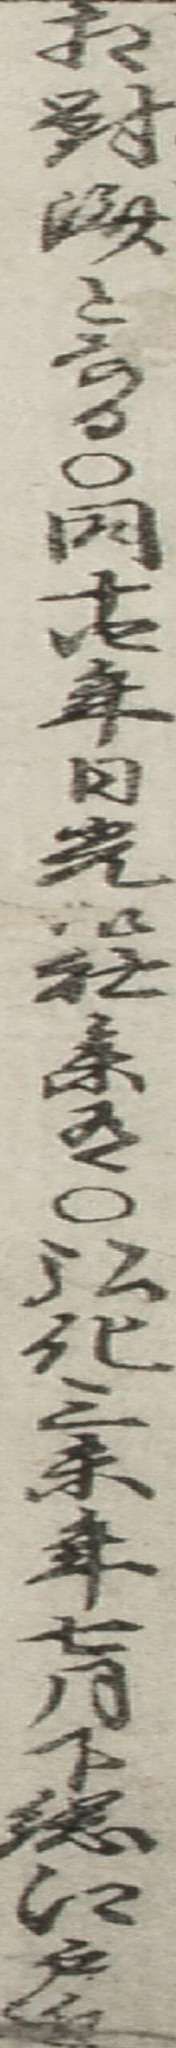相対済となる〇同十四年日光御社参有〇弘化三未年七月下総江戸近
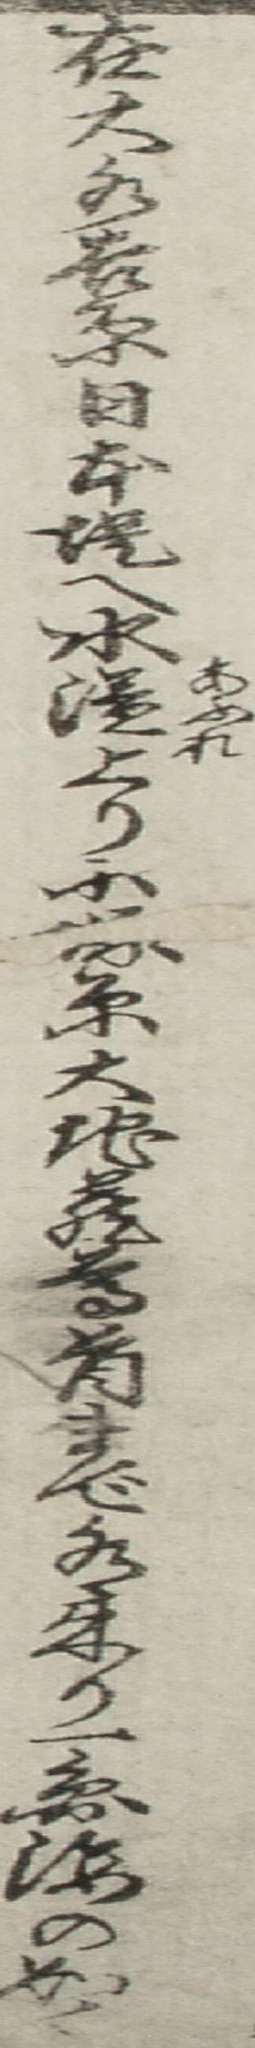在大水吉原日本堤へ水溢上り小塚原大地蔵尊首まで水来り一円海の如く
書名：安政見聞誌　下
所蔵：東京大学地震研究所図書室 Earthquake Research Institute Library, The University of Tokyo, JAPAN
